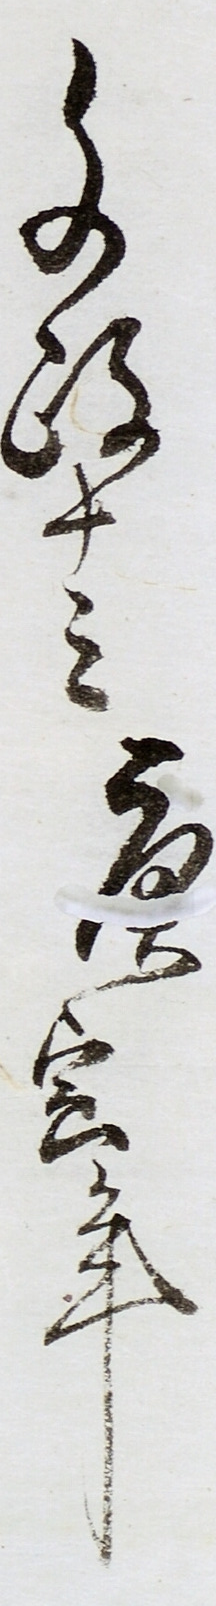文政十三庚寅年
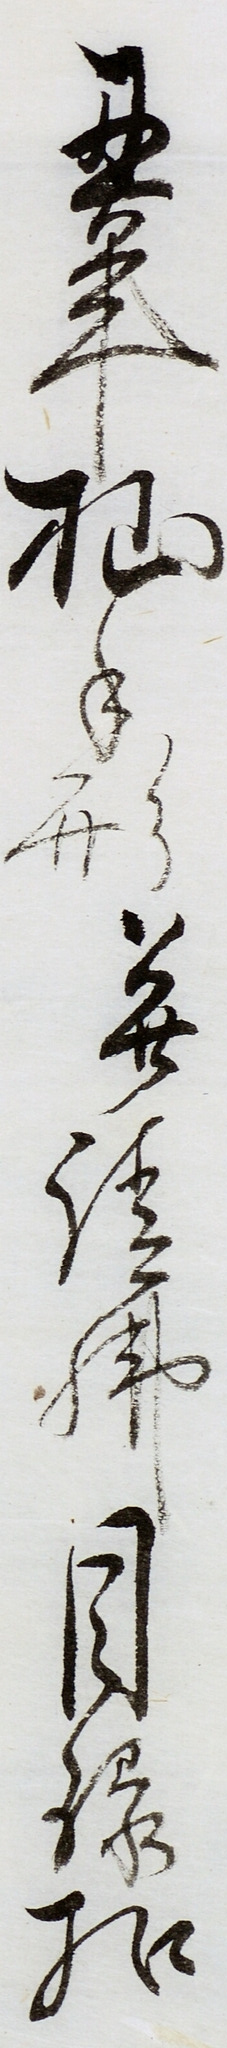丑年杣手形并諸払目録扣
